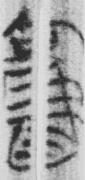○（觀）
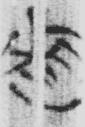逨（賚）
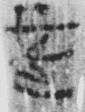武
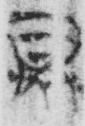鼎（則）
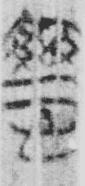懠（齊）
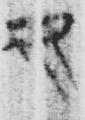女（如）
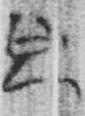也
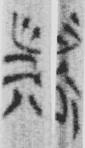斯
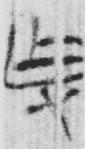拃（作）
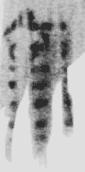○（觀）
